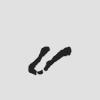㠯（以）
